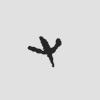又
